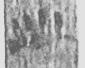卌
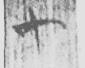七
